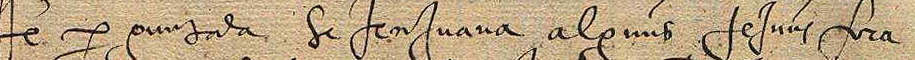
Jtē ꝑguntada Se JenJuaua alguūs Jejuūs fora
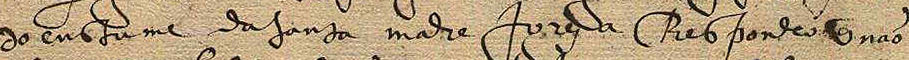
do custume da Santa madre Jgreja Respondeo q̄ naõ
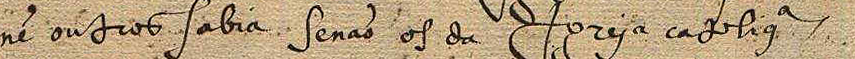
nē outros sabia Senaõ os da Jgerja catoliqa /
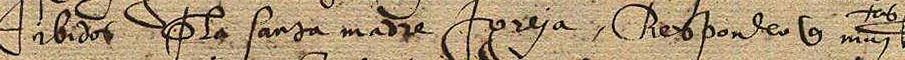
ibidos p̄la santa madre Jgreja / Respondeo q̄ mujtas
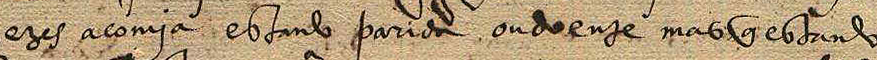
vezes a comja estando parida ou doente mas q̄ estando
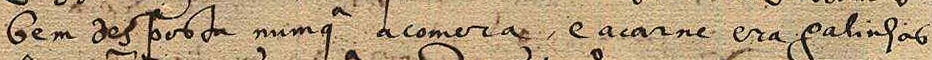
bem desposta numqa a comera / e a carne era galinhas
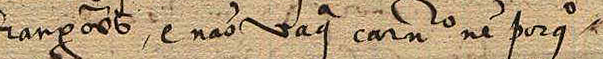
frangãos / e naõ vaqa carnro nē porqo /
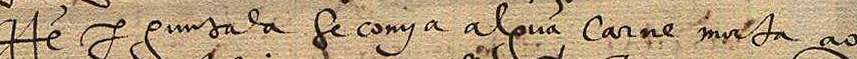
Jtē ꝑguntada Se comja alguā Carne morta ao
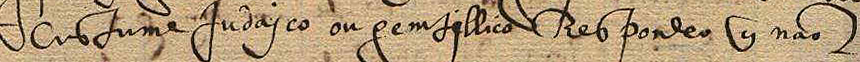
Custume Judajco ou gemtjllico Respondeo q̄ não
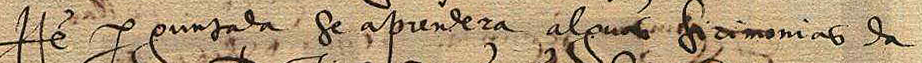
Jtē ꝑguntada Se aprendera alguās Sirimonias da
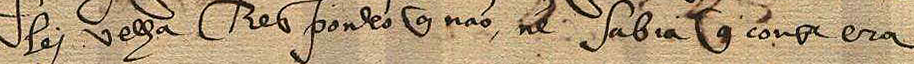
lej velha Respondeo q̄ naõ / nē Sabia q̄ cousa era
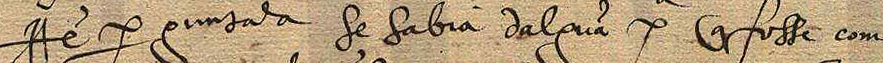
Jtē ꝑguntada Se Sabia dalguā pa q̄ fosse com
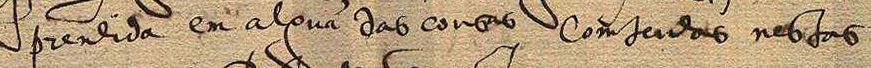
prendida em alguā das cousas Comteudas nestas
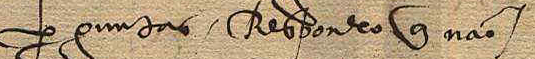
ꝑguntas / Respondeo q̄ naõ /
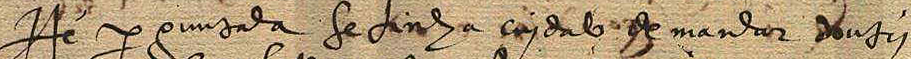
Jtē ꝑguntada Se tinha cujdado de mandar doutrj
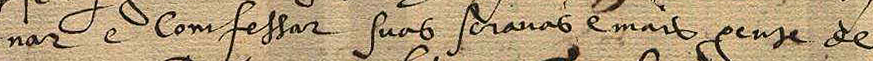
nar e Comfessar suas scrauas e mais gente de
